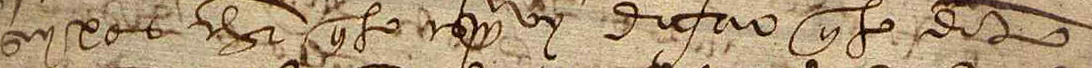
seyxas c̄hr q̄ ho esp̄vy diguo q̄ ho dito
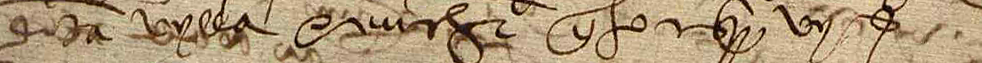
dita vylla e eu c̄hr q̄ ho esp̄vy
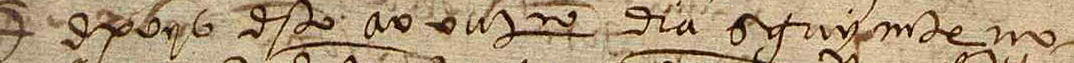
E depoys desto ao outro dia seguymte no
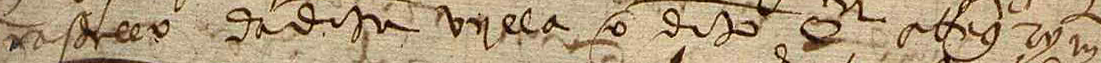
castello da dita vylla o dito Cor a Req̄rymto
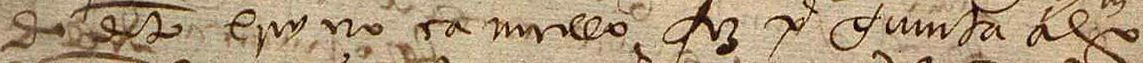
do dito bryçio camello fez p̄gumta aho
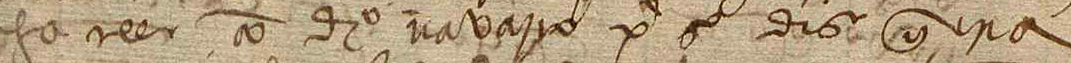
nha elle c̄o djo navaro p̄so dise q̄ era
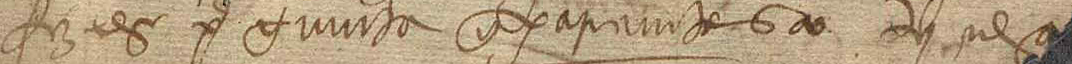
fez lhe p̄gumta q̄ paremtesco tynha
